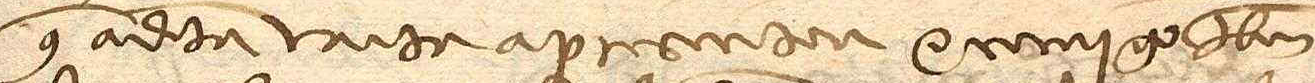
q̄ a dita carta apresentou e comjgo t̄bam
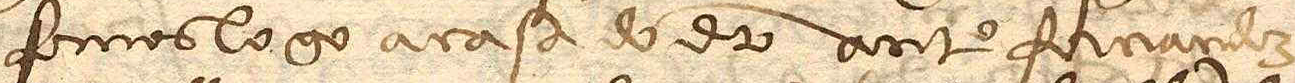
fomos logo a casa do d̄to anto fernandez
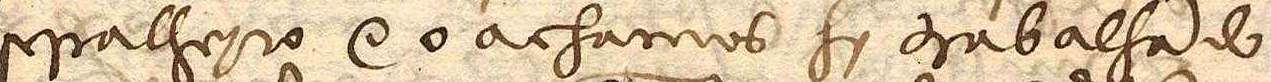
serralheyro e o achamos hy trabalhādo
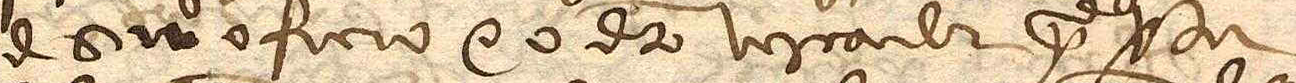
de seu oficio e o d̄to vereador p̄o ꝟtu
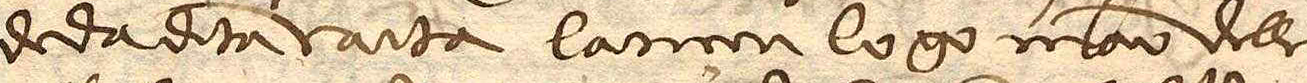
de da dita carta lançou logo mão delle
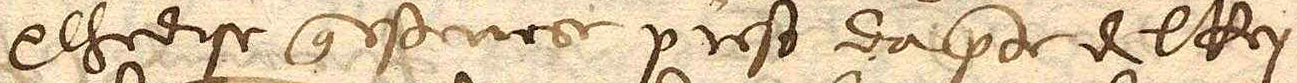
e lhe dise q̄ esteuese preso da p̄te del Rey
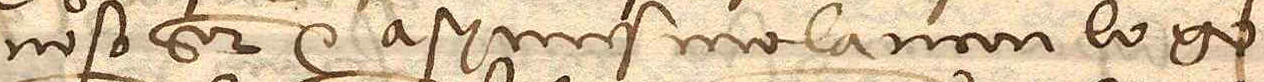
noso s̄or e asy mesmo lançou logo
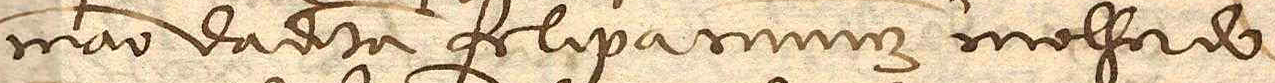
mão da dita felipa nunez molher do
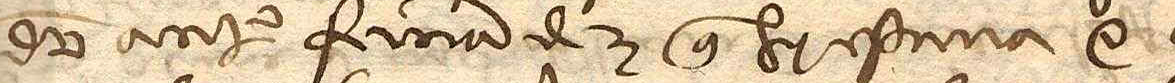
d̄to anto fernādez q̄ hy estaua e a
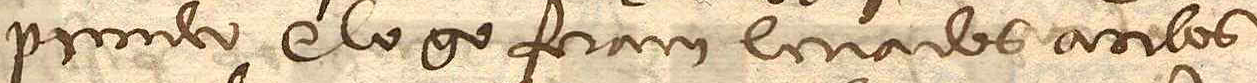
prendeo e logo foram leuados anbos
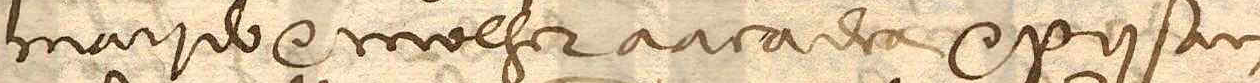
marjdo e molher aa cadea e prjsam
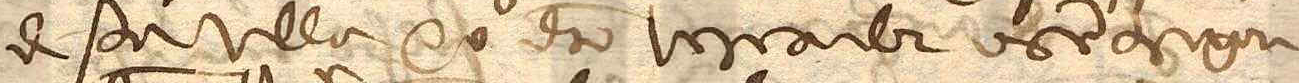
desta villa e o d̄to vereador os ētregou
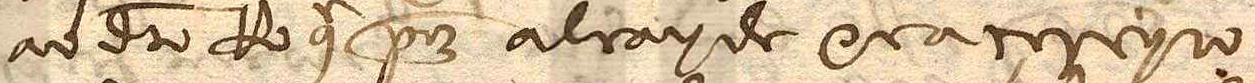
ao d̄to Roqe p̄iz alcayde e caçereyro
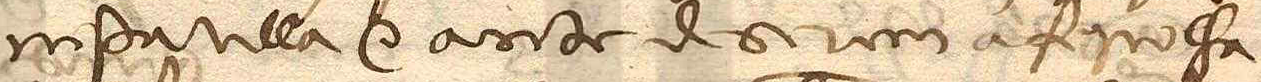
nesta villa e ante de serem aferrolha
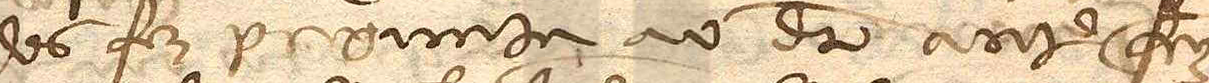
dos fez pregunta ao d̄to anto f̄rz
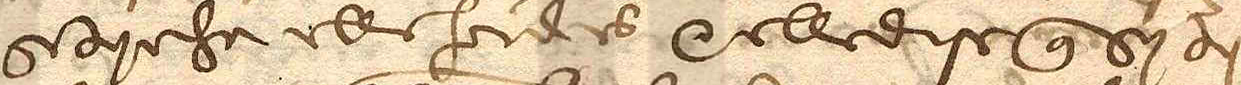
se tynha elle hord̄ees e elle dise q̄ sy ty
